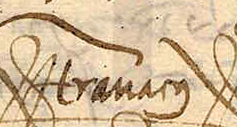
dtrauacos
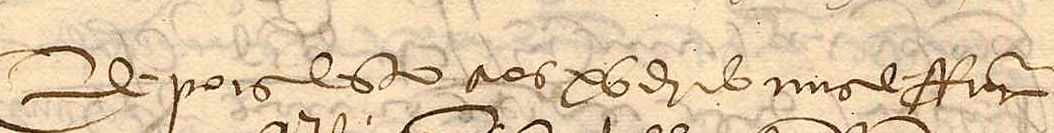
E depois desto aos xb djas do mes de fevero
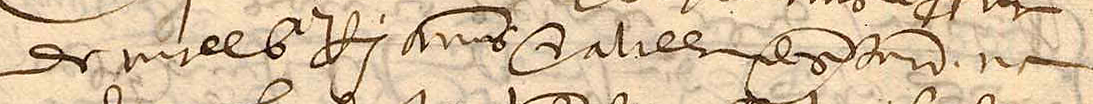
de mill bc Rj an̄os ē a villa de sātarē na
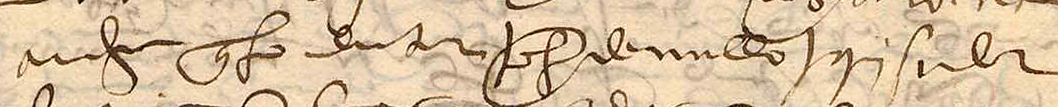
auda q̄ ho doutor Johā de mello Jqysidor
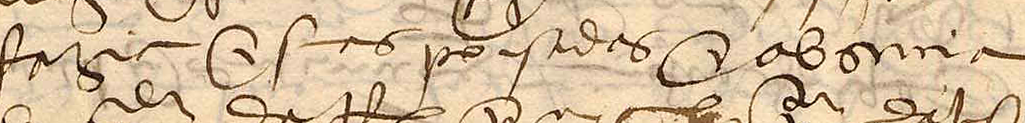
fazia ē suas pousadas ē absençia
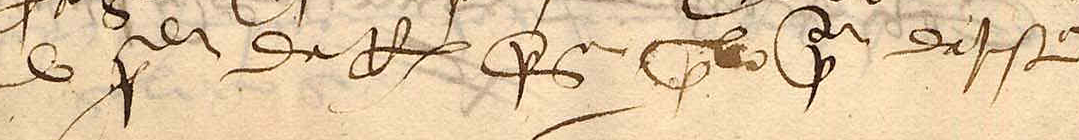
do ꝓdor da Rꝭ p̄sa p̄lo p̄tor da Justa
